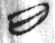日
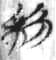利（利）
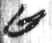㠯（以）
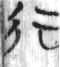行
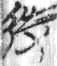{尸拃}（作）
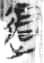○（蹠）
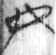四
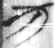方
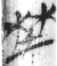埜（野）
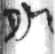外
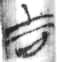吉
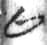㠯（以）
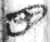田
